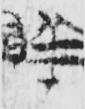牂
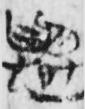○（舉）
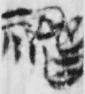禱
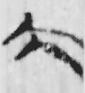大
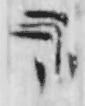水
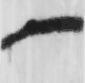一
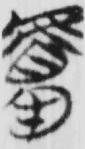膚
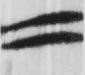二
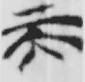天
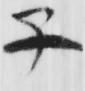子
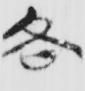各
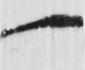一
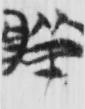牂
